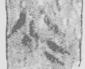八十=
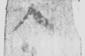六
